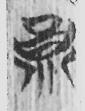員
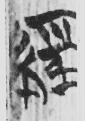經
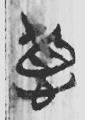惪
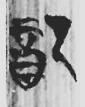配
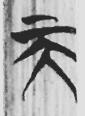天
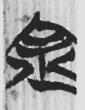余
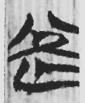罔
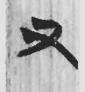又
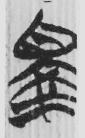睪
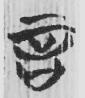言
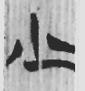少
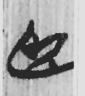臣
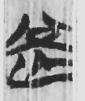罔
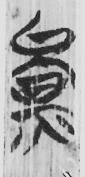{允炅}
